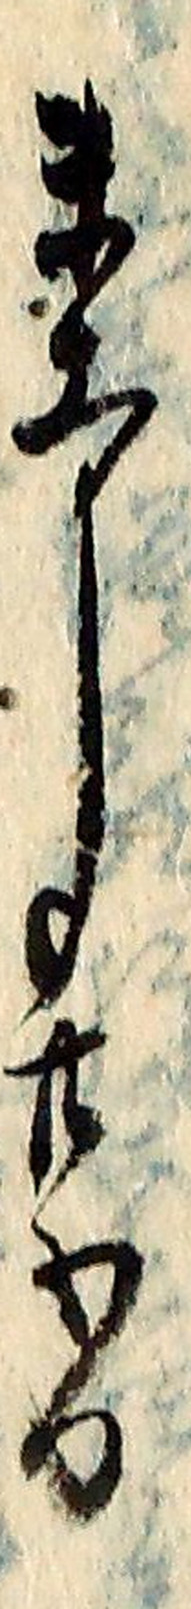未十一月廿五日
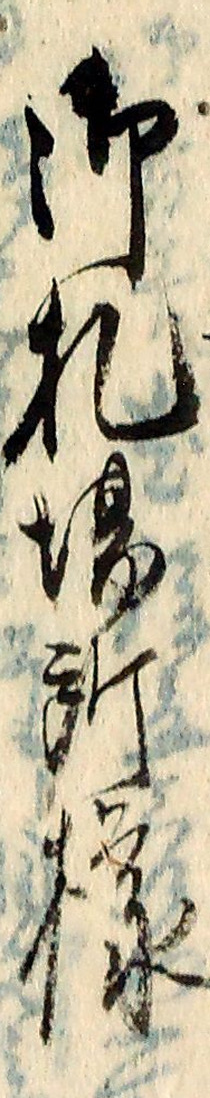御札場所様
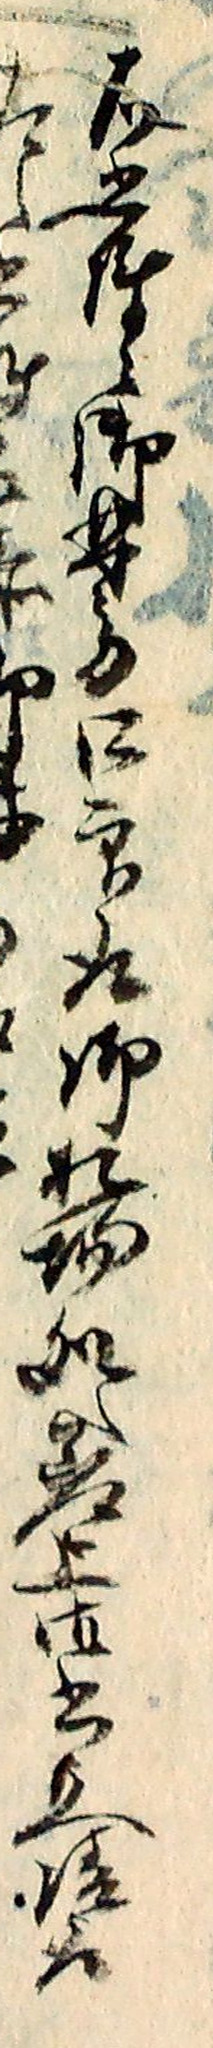右書附に御林方御印取御札場処へ差上御書かへ請取
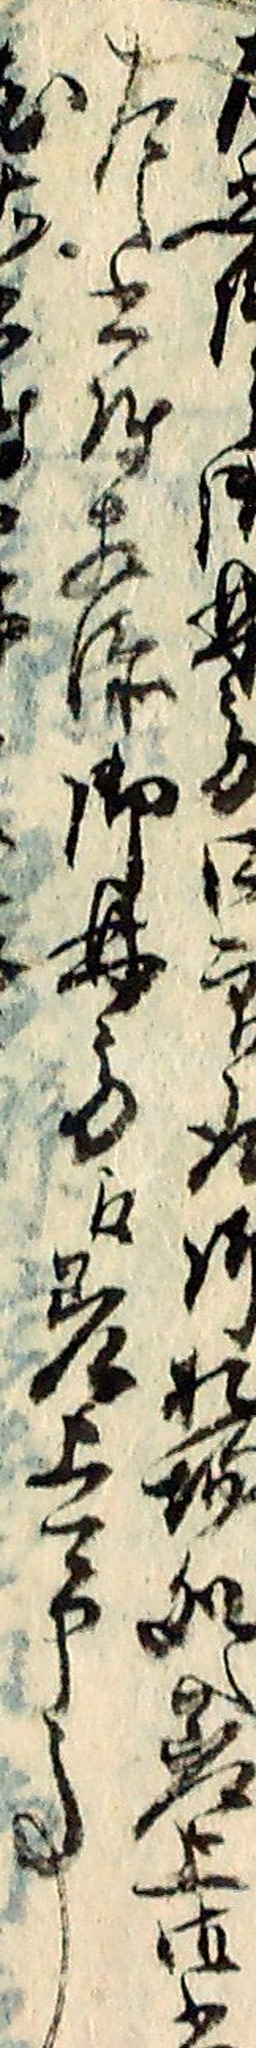左之書附相添御林方え差上可申事
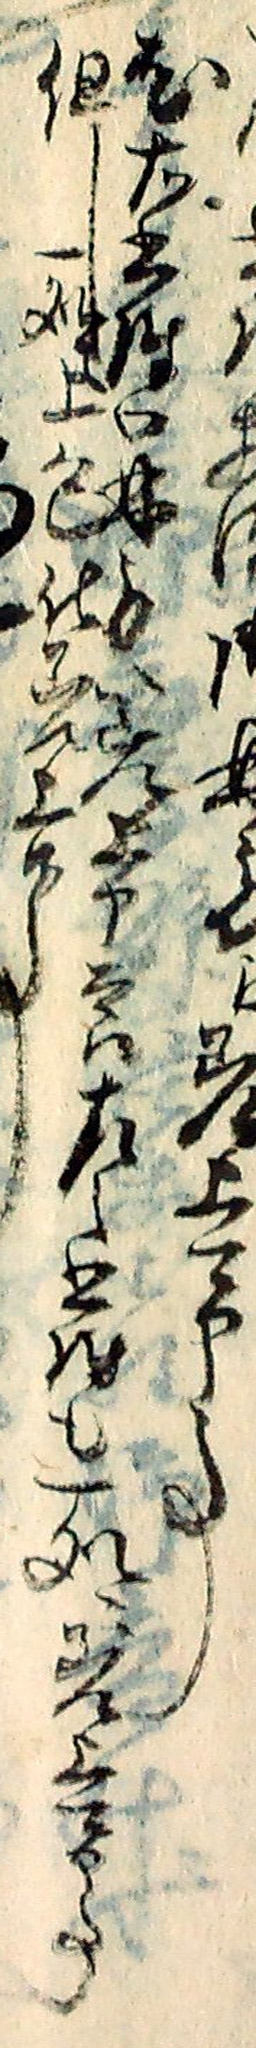尤尤右書附御林方へ差上申節左の書附も一処に差上可申事
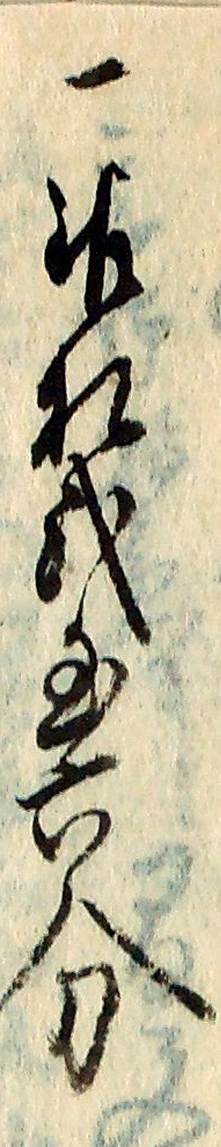一銀札弐匁六分
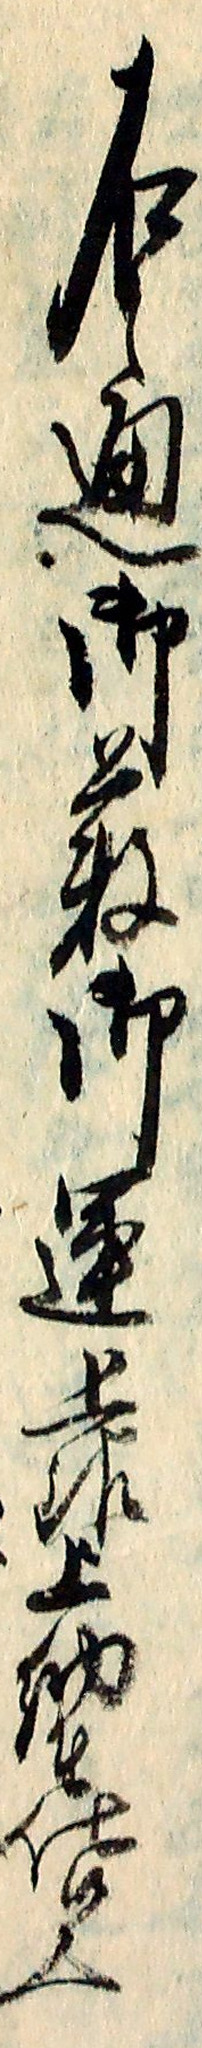右之通御藪御運上銀上納奉仕候以上
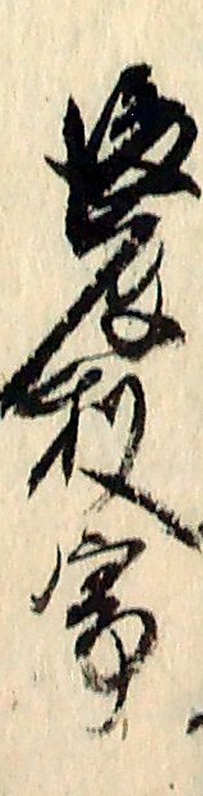後藤利八郎
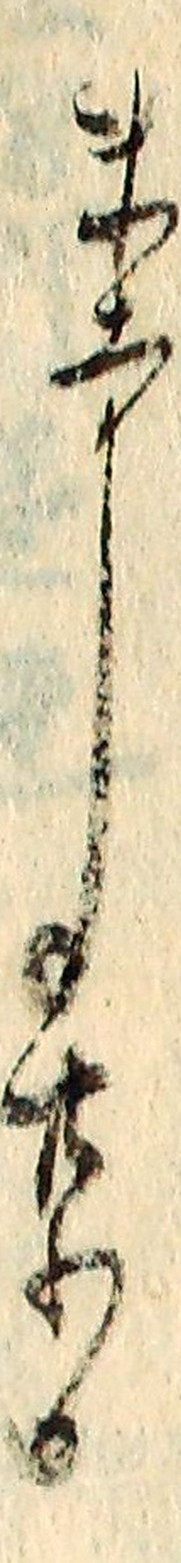未十一月廿五日
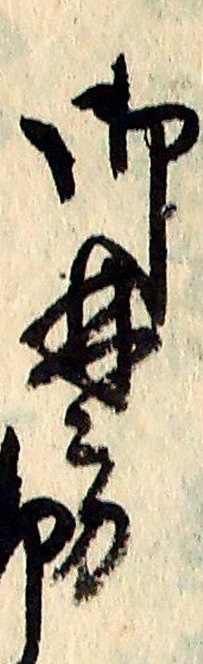御林方
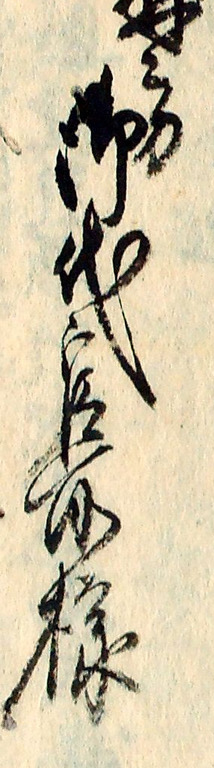御代官所様
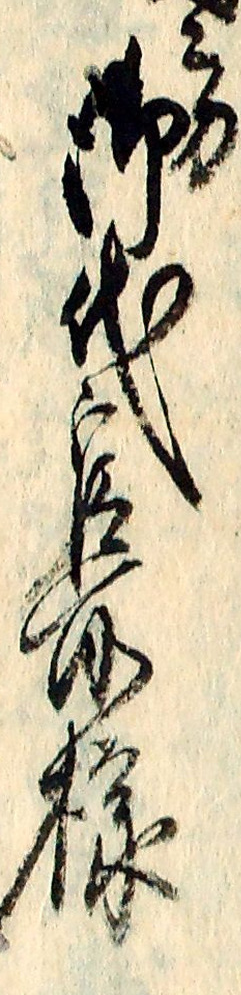御代官所様

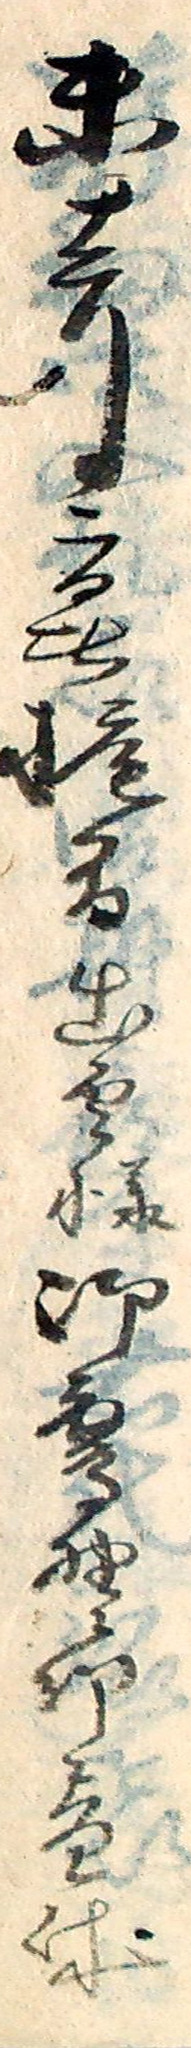未十二月二日比梶間出雲様御鷹野に御昼休
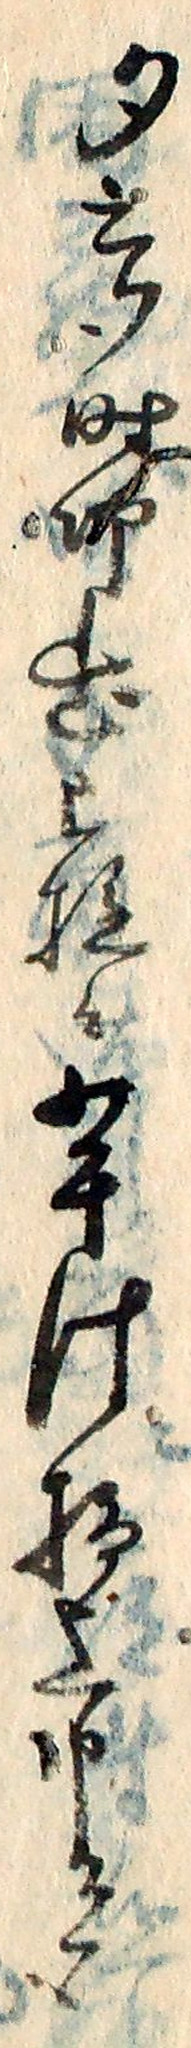夕六つ時御出被遊候芋汁指上申候以上
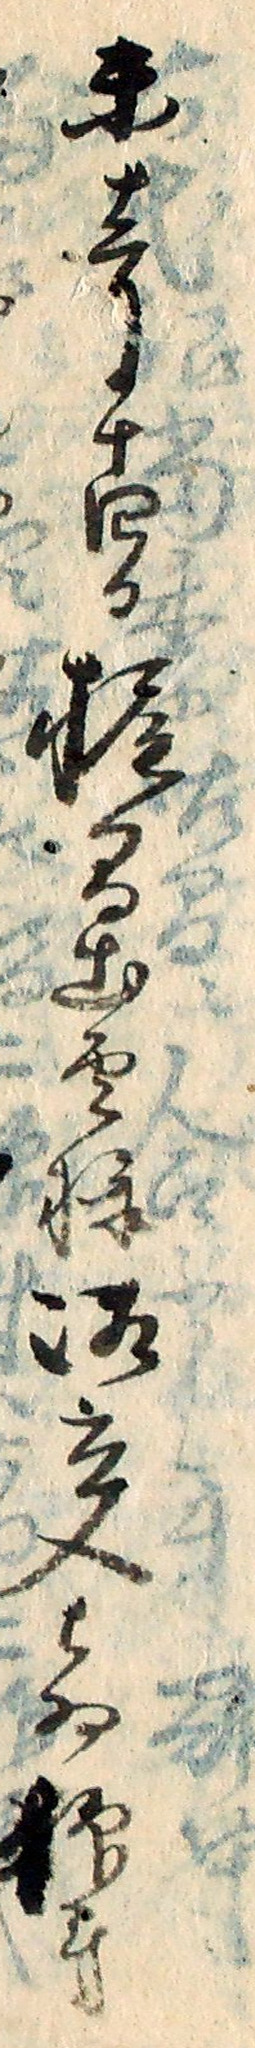未十二月十四日梶間出雲様御立入被為仰付
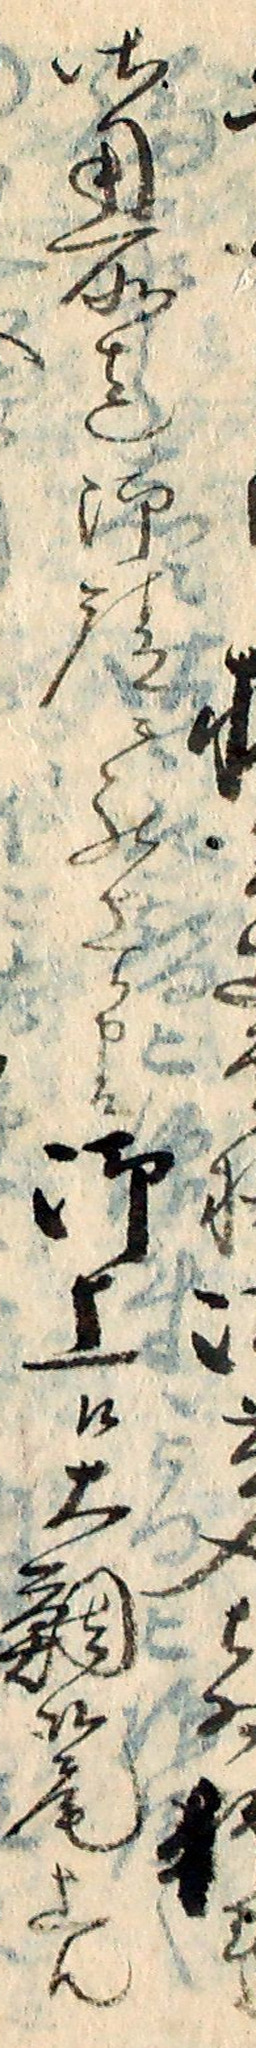御用所迄御請に罷上り申候御上候大鯛弐尾上る
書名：諸御願書控(後藤氏壱番）
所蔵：鳴門教育大学 Naruto University of Education
